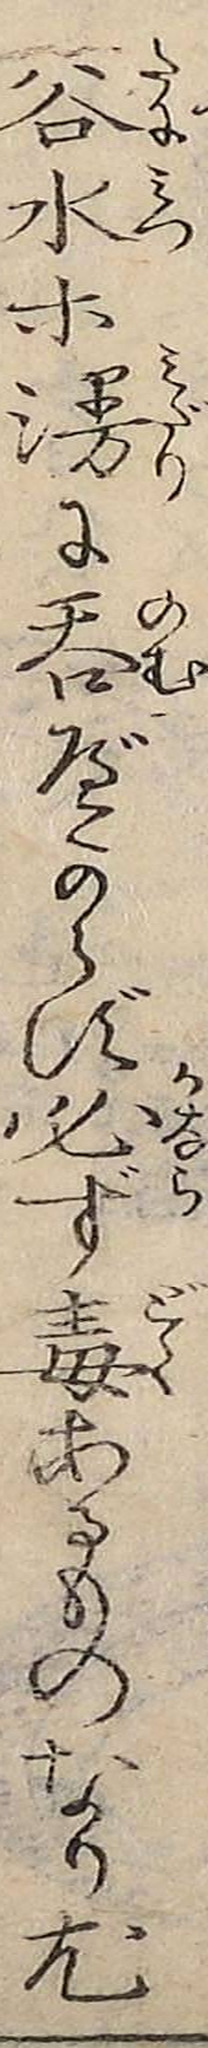谷水等漫湯に呑べからず必ず毒あるものなり尤
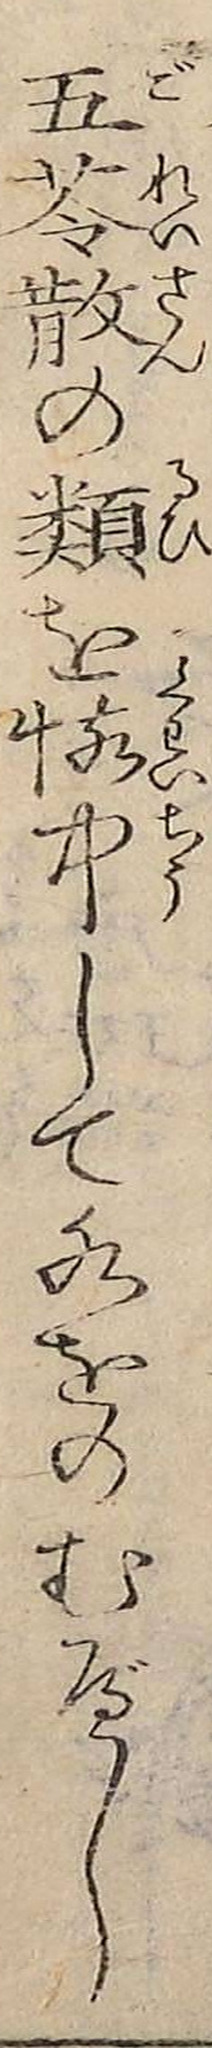五苓散の類を懐中して水をのむべし

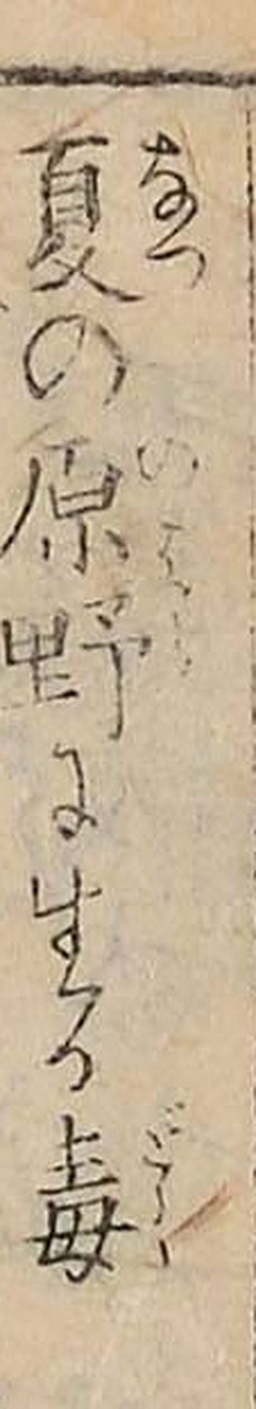夏の原野に生る毒
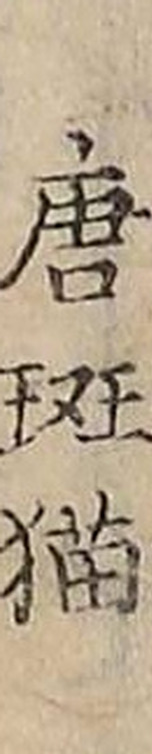唐斑猫
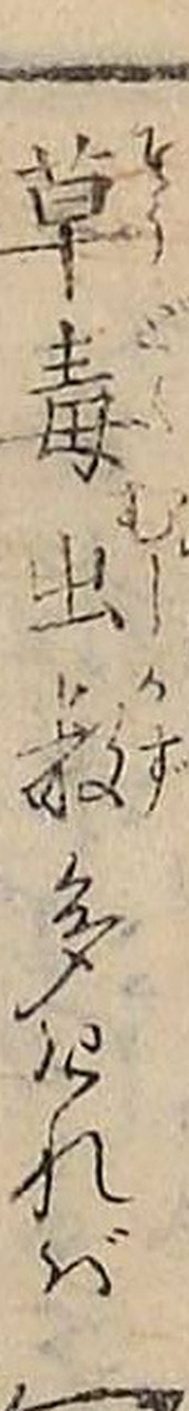草毒虫数多ければ
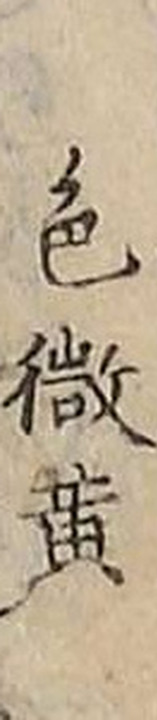色微黄
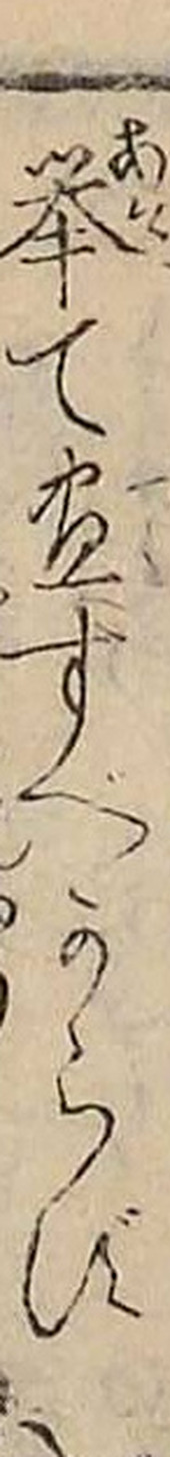挙て尽すべからず
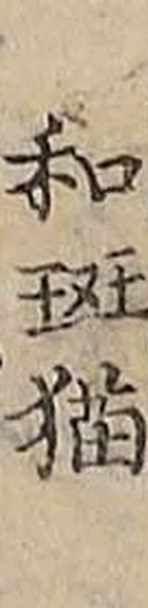和斑猫
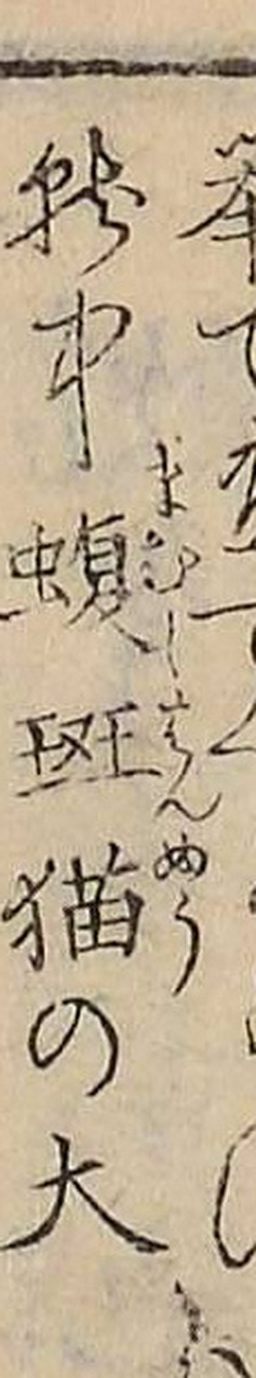就中蝮斑猫の大
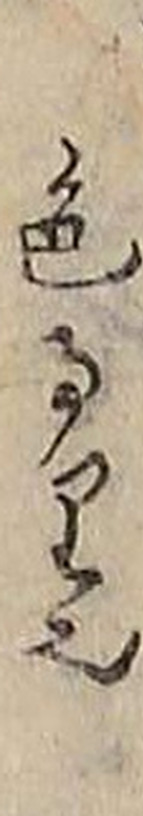色るり也
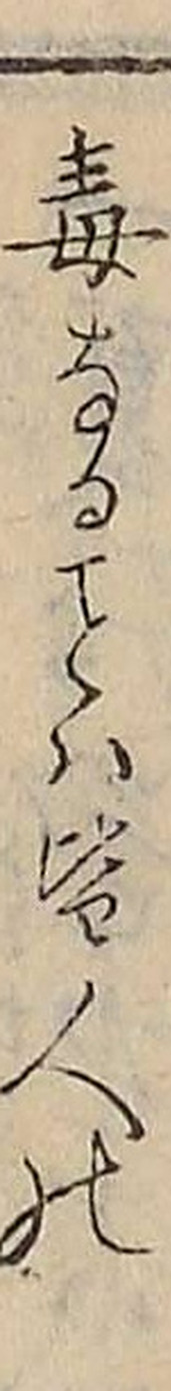毒なることは皆人の
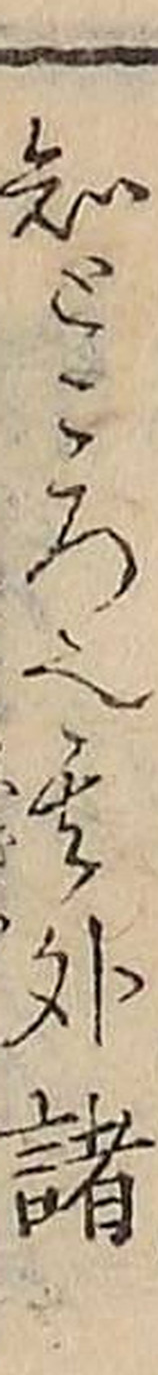知ところ也其外諸
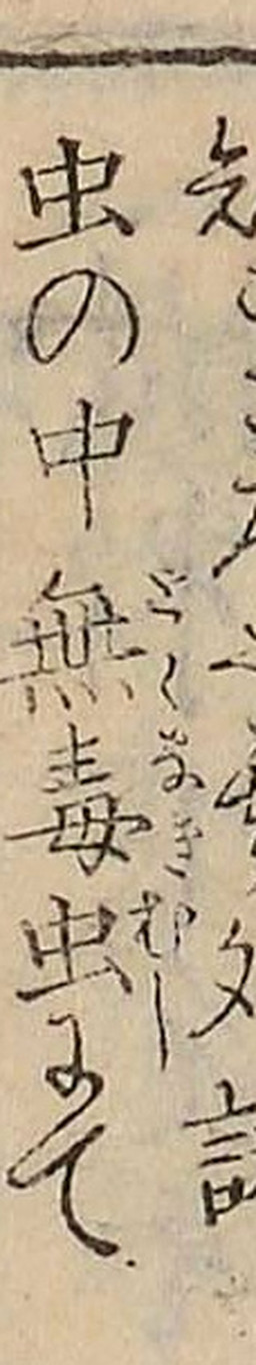虫の中無毒虫にて
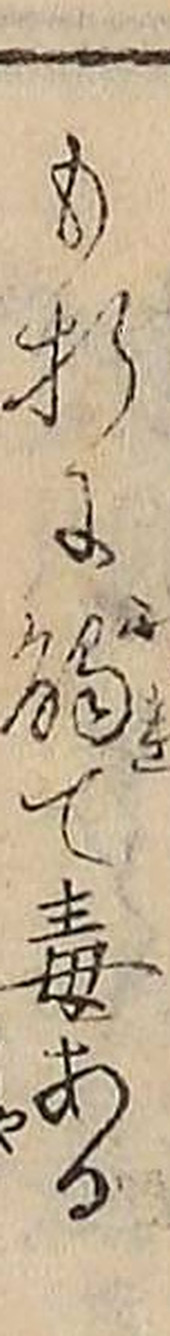も折に触て毒ある
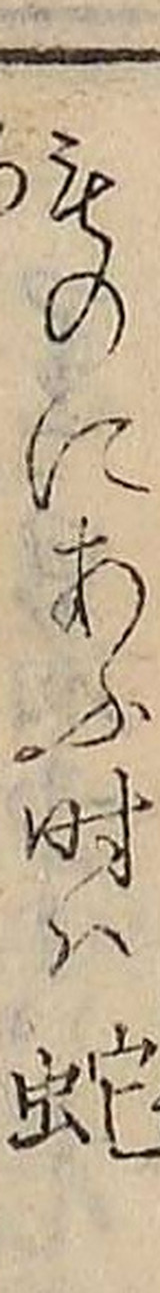ものにあふ時は蛇
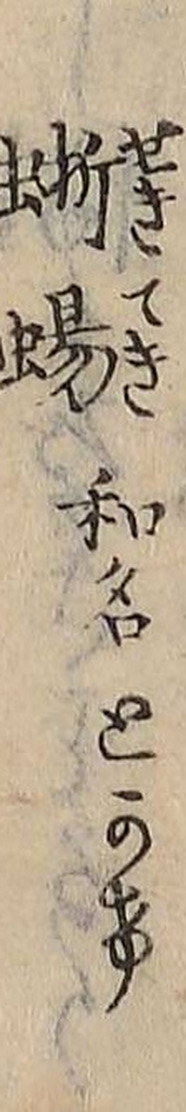蜥蜴和名とかけ
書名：旅行用心集
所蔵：神戸大学附属図書館 国文学研究資料館
